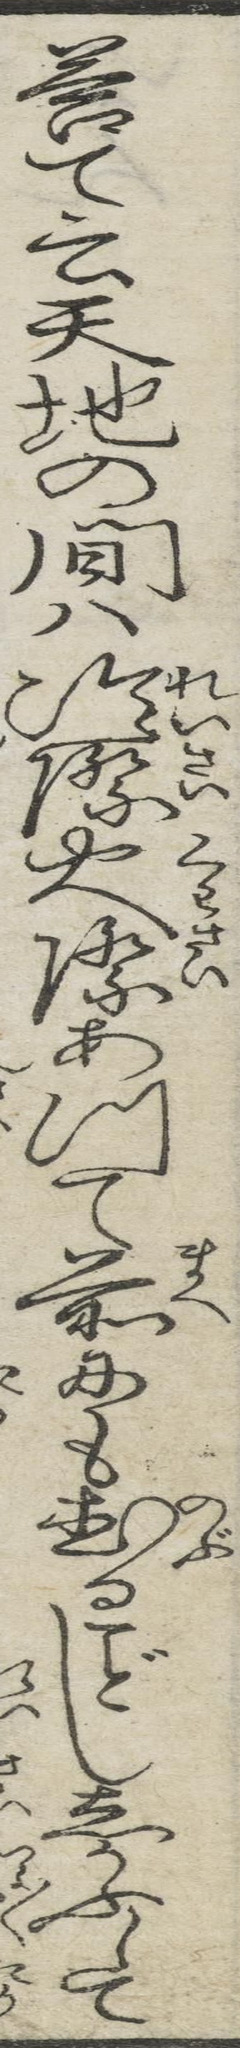答て云天地の間は冷際火際あつて前にも述るごとししかふして
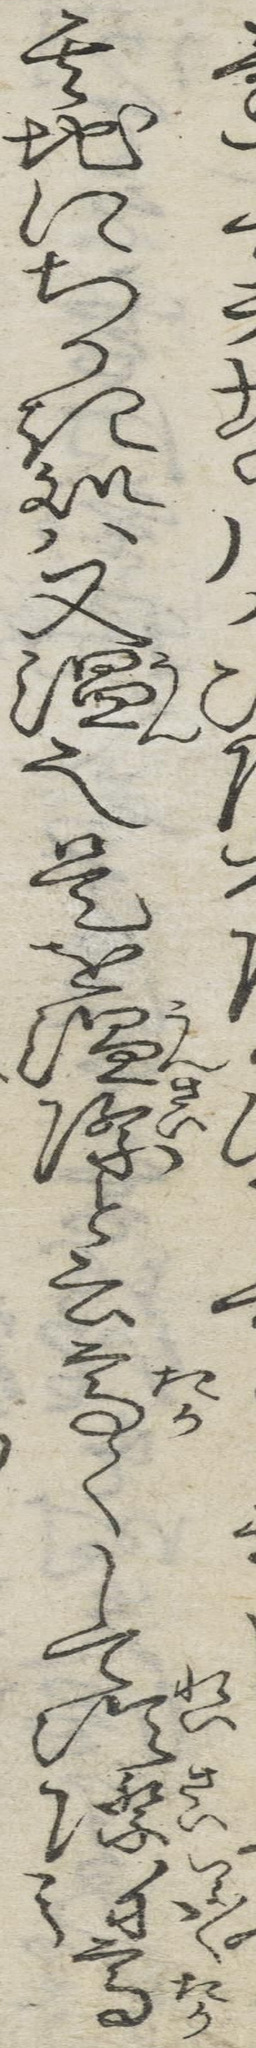其地にちかき処は又温也是を温際と云高くして冷際弥高
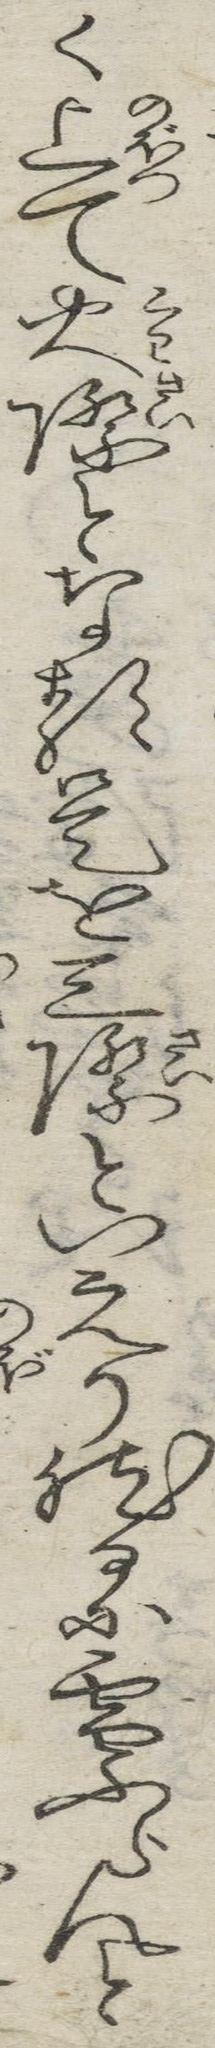く上て火際となる是を三際といえり然るに雪ふらんと
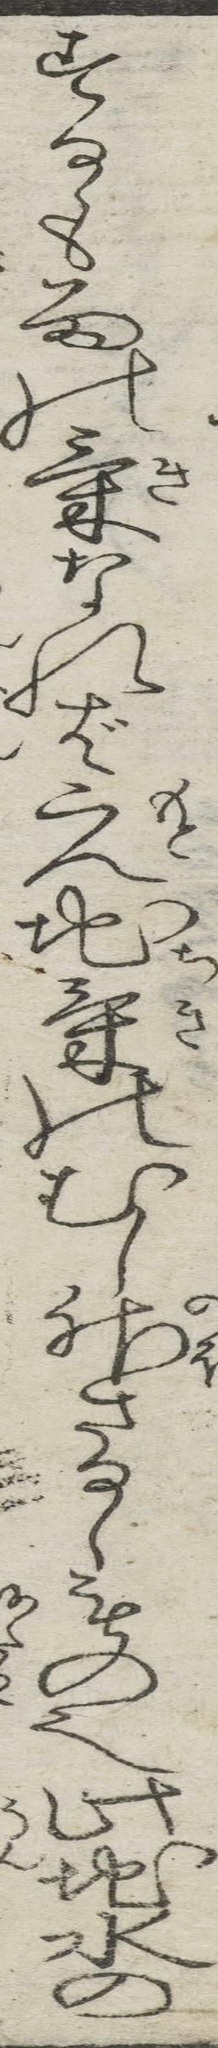するも雨の気なれば元地気のむし升さるゝもの也此地水の
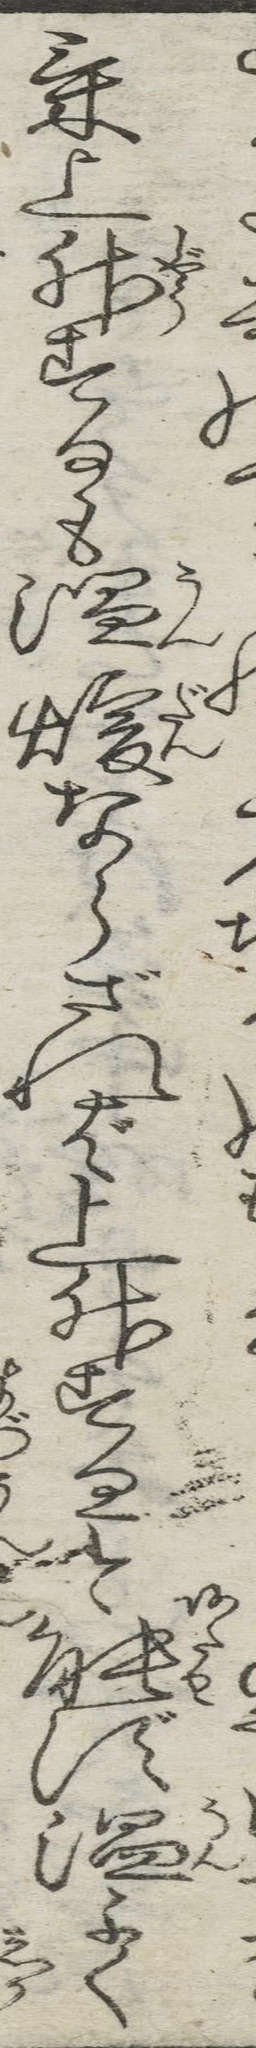気上升するも温暖ならざれば上昇すること能ず温よく
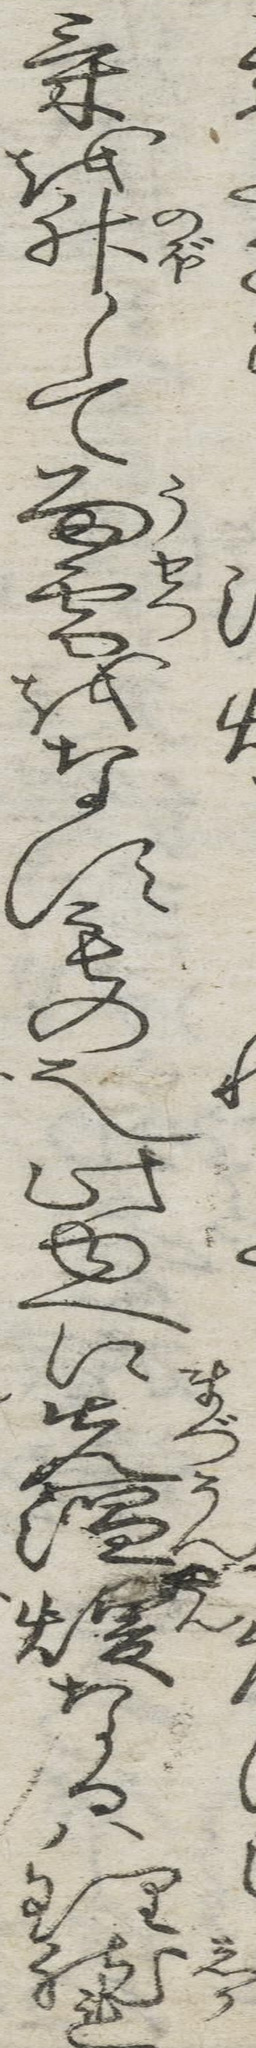気を升して雨雪をなすもの也此ゆへに先温暖なるは理然れ
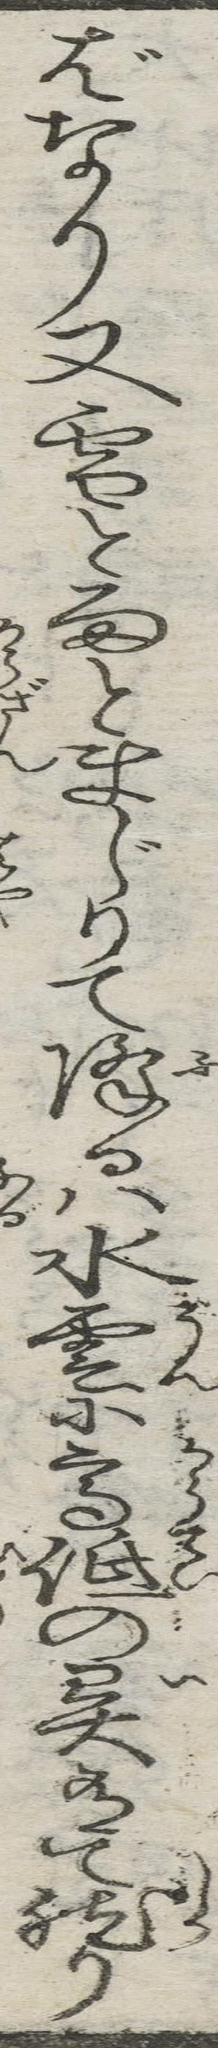ばなり又雪と雨とまじりて降るは水雲に高低の異有て然り
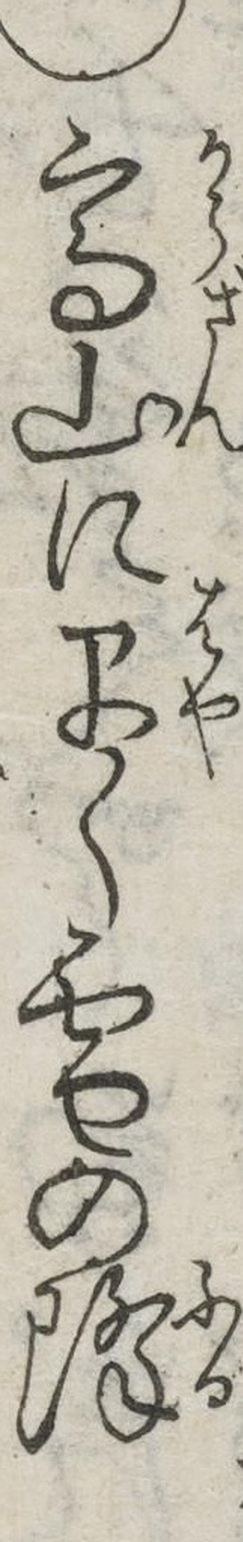〇高山に早く雪の降
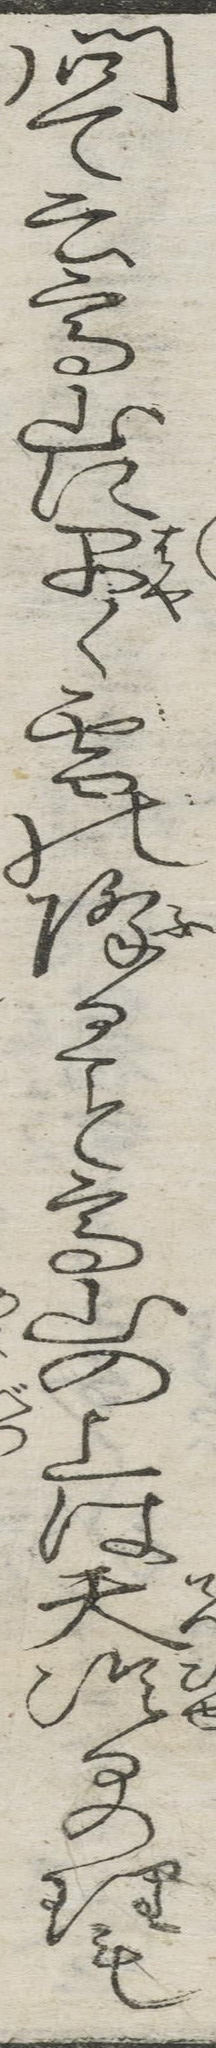問て云雪山に早く雪の降ること雪山の上は天冷るの理も
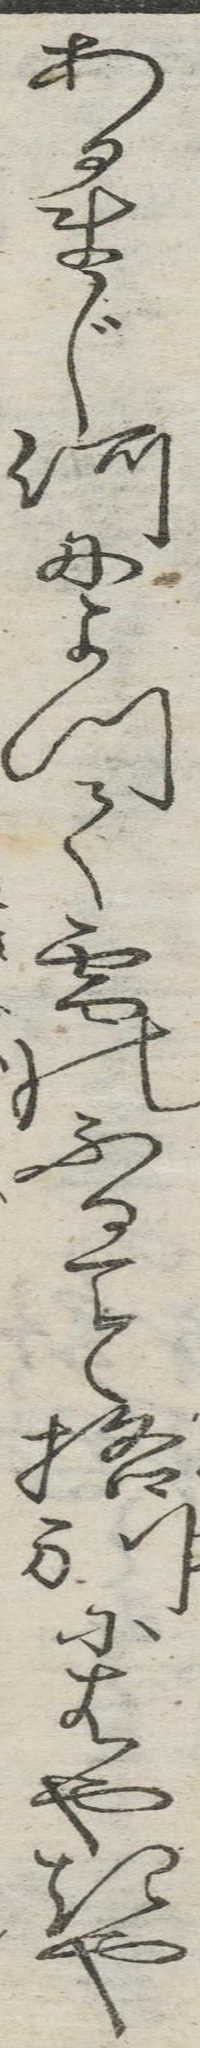あるまじ何によつて雪のふること格別にはやきや
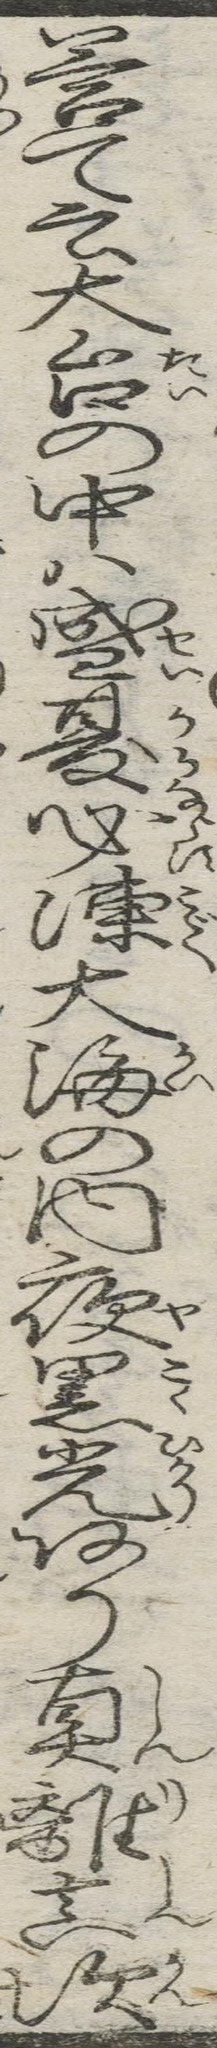答て云大台の中は盛夏必凍大海の内夜黒光あり真離真坎
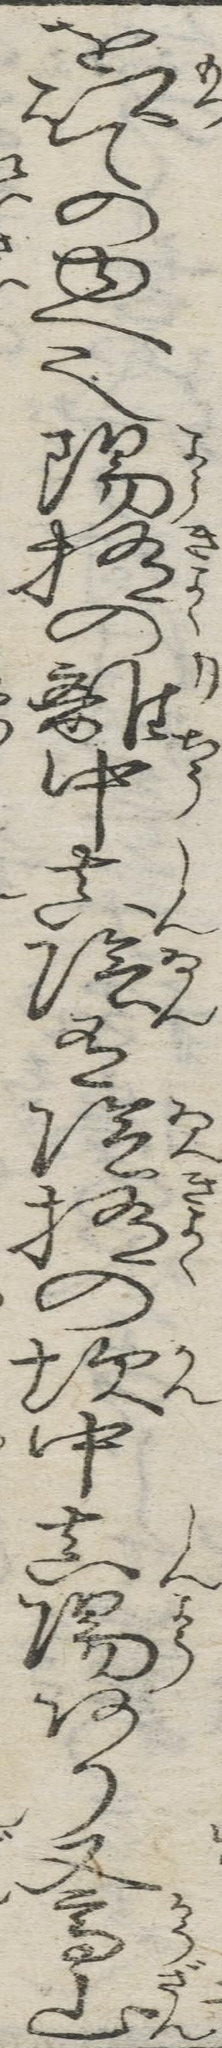を以てのゆへ也陽極の離中真陰有陰極の坎中真陽あり又高山
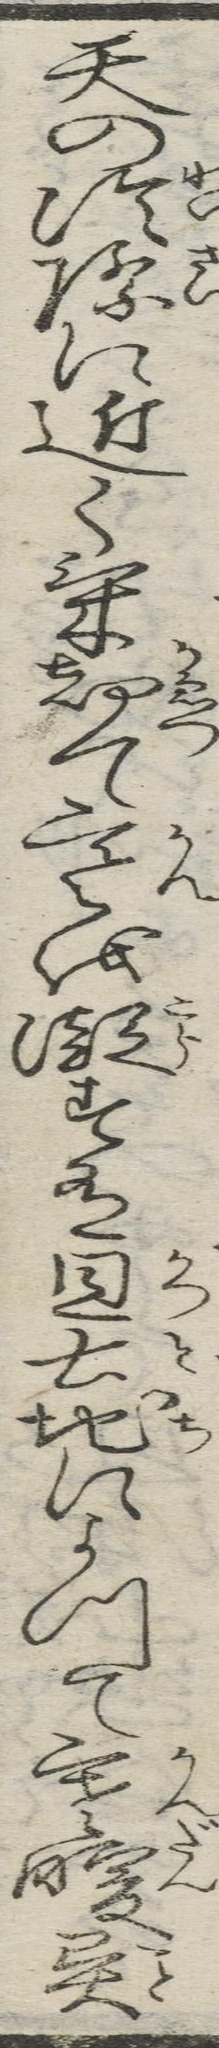天の冷際に近く気却て雲を凝す有且土地によつて寒暖異
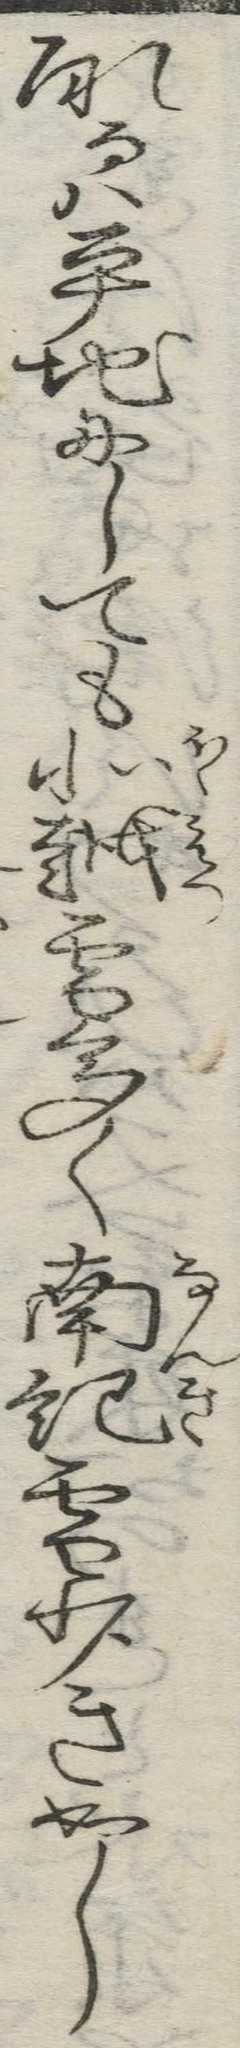なるは平地にしても北越雪多く南紀雪少き如し
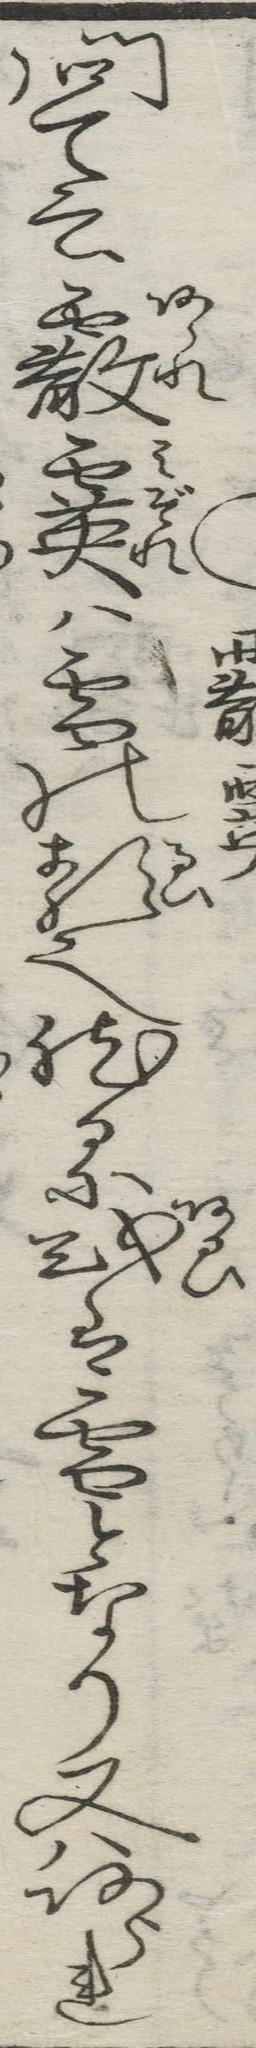問て云霰霙は雪の類也然るに或は雪となり又はあられ
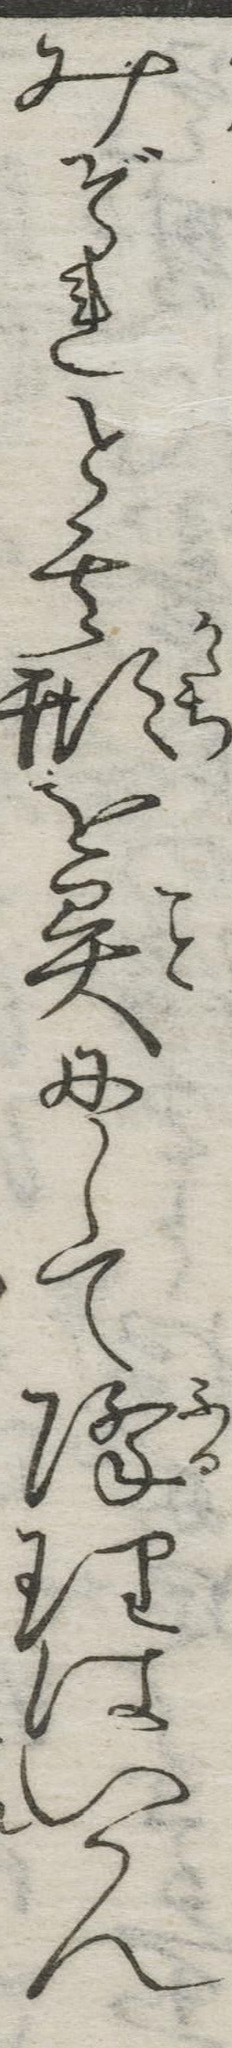みぞれと其形を異にして降理はいかん
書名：訓蒙天地辨　地
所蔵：東京大学地震研究所図書室 Earthquake Research Institute Library, The University of Tokyo, JAPAN
